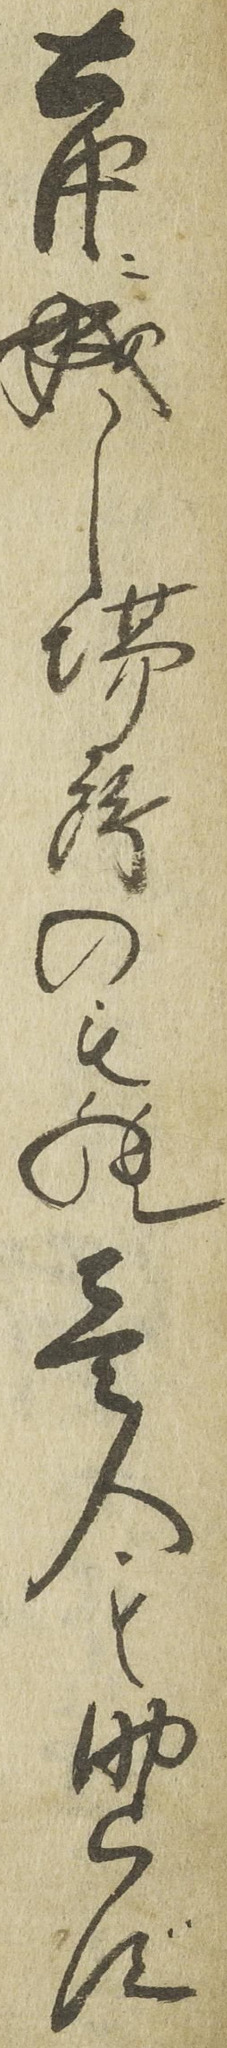土中ニ成し場所のもの共壱人も助らず
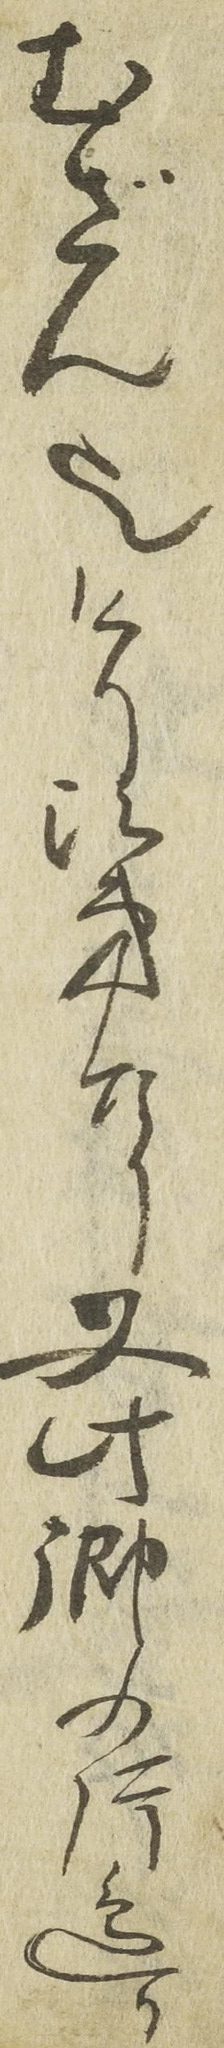むざん也ける次第なり又此郷の片辺り
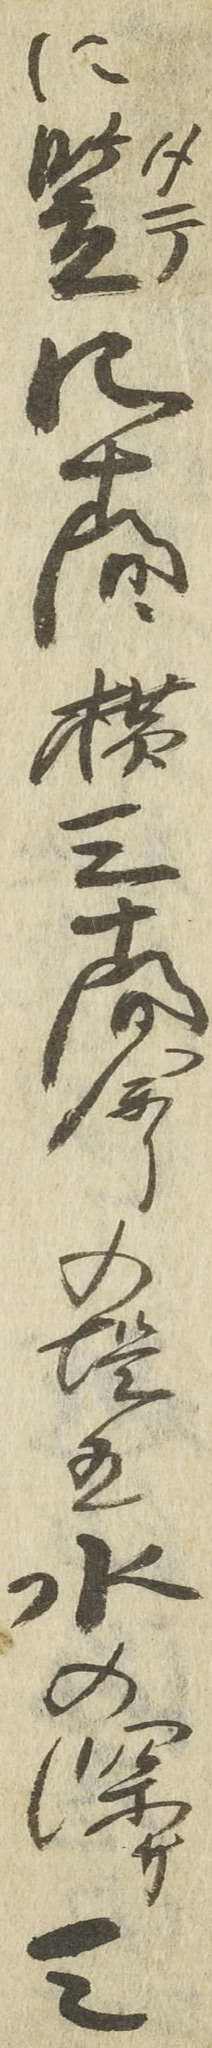に竪四十間横三十間余りの堤有水の深サ三
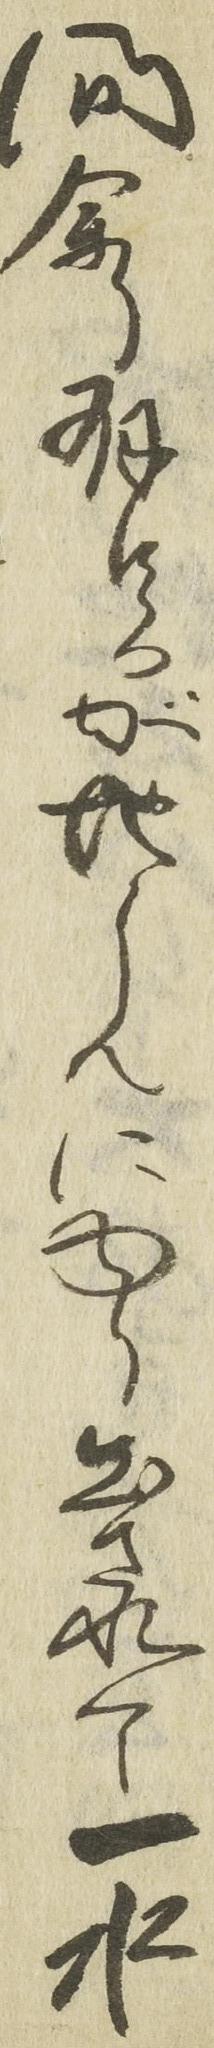間余り有りけるが地しんにゆり出されて一水
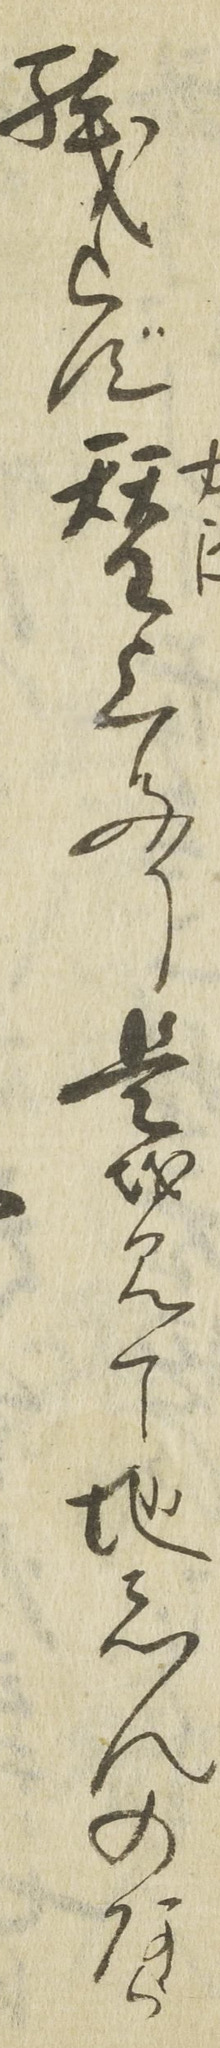残らず替上たり是を見て地しんのあら
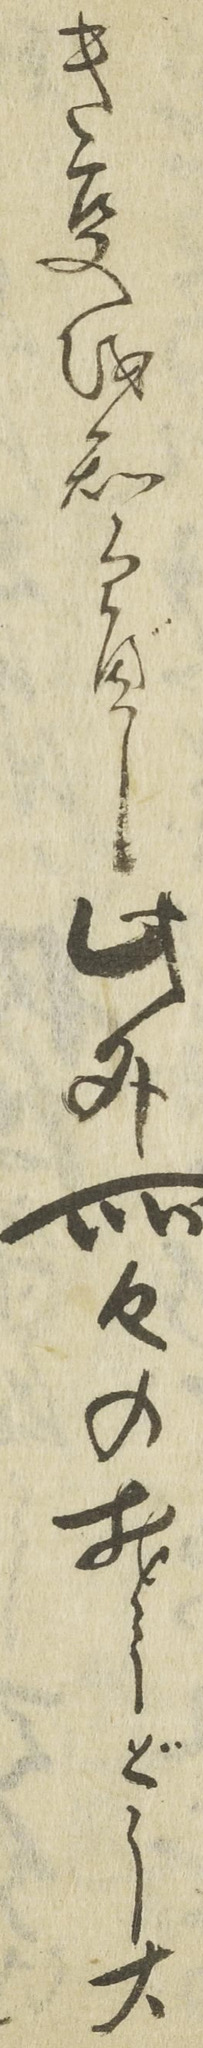き事を知るべし此外所々のそうどう大
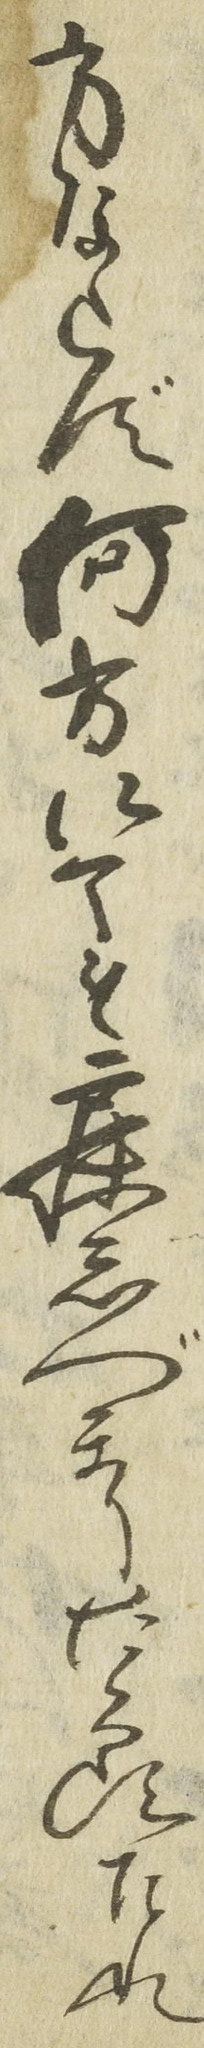方ならず何方にても寝しづまりたる頃なれ
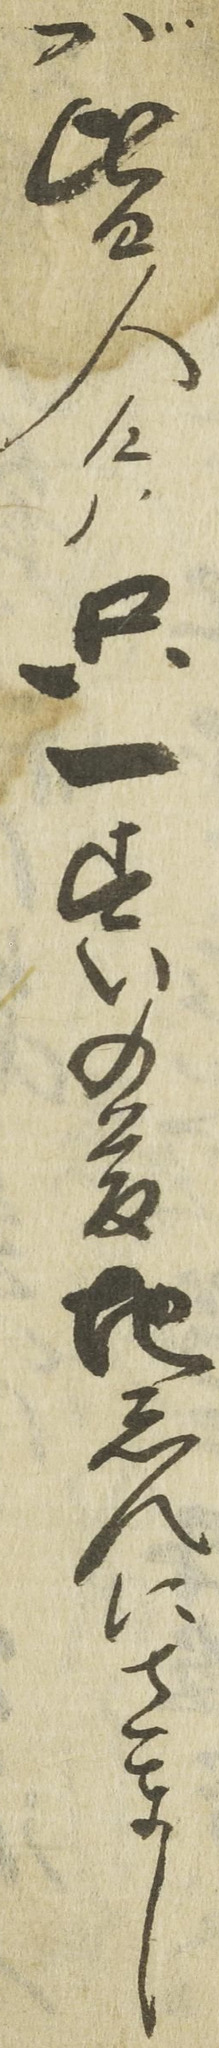ば皆人々は只一すいの夢地しんにさまし
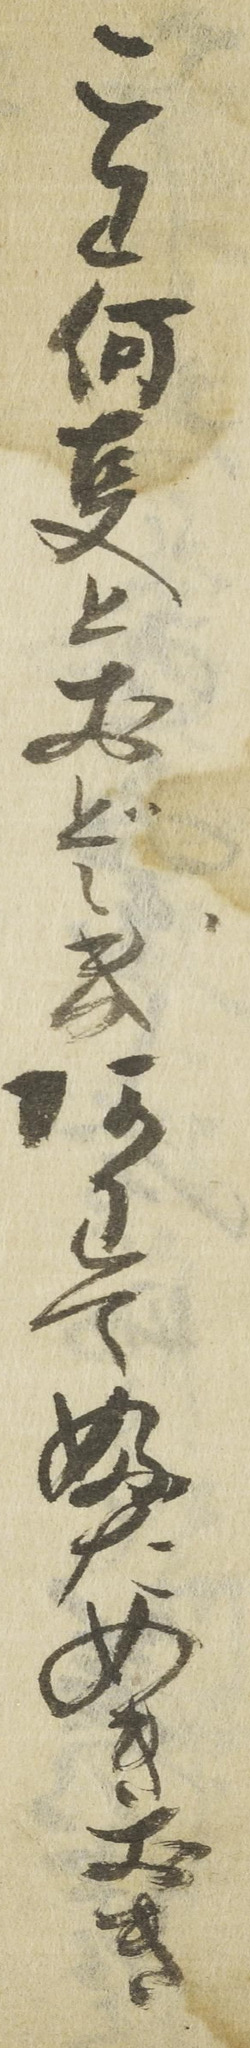こわ何事とおどろきあわてふためきおき
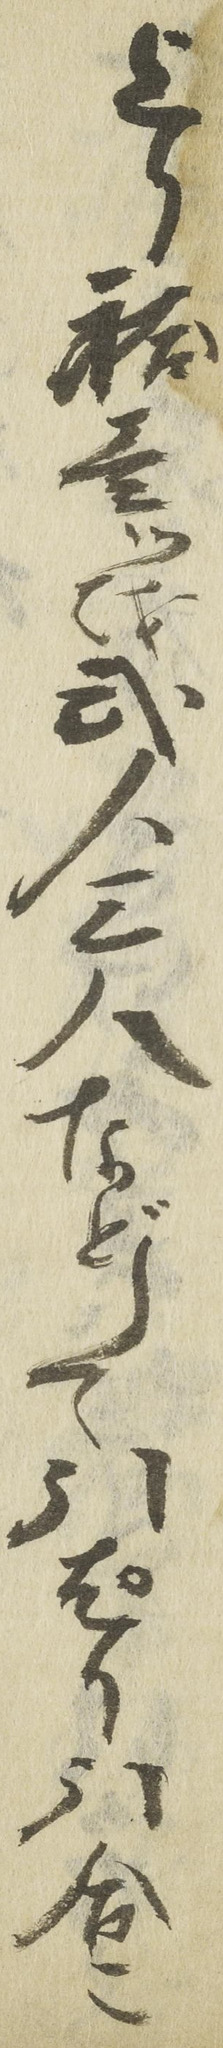上り袷壱ッを弐人三人などして引ぱり引合こ
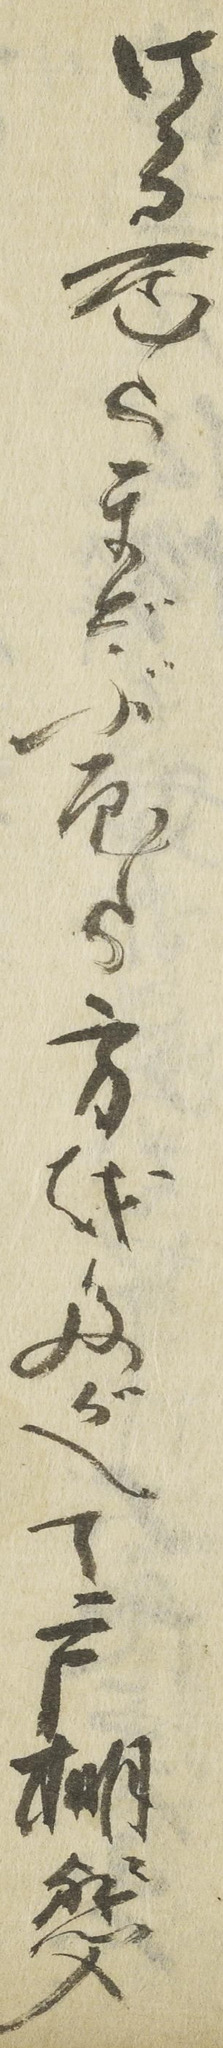けるやらまどぶやら方をたがへて戸棚ニ懸然入
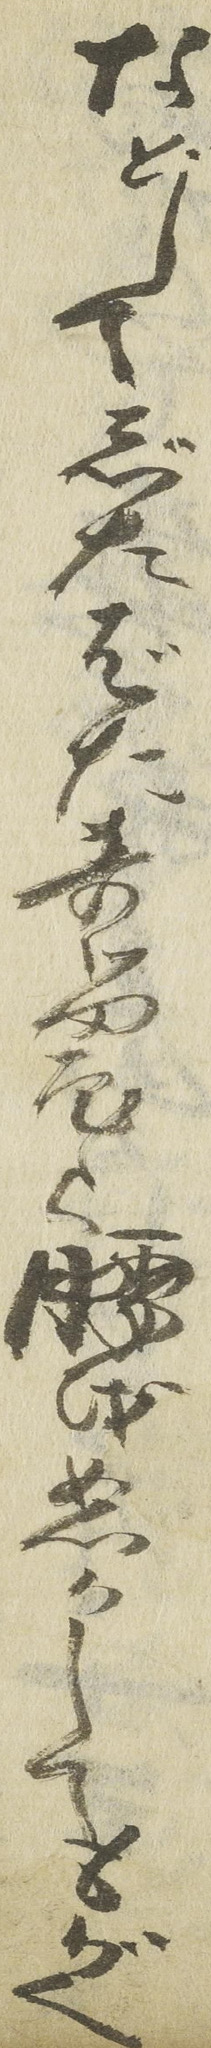などしてじたばたするやら腰をぬかしてもがく
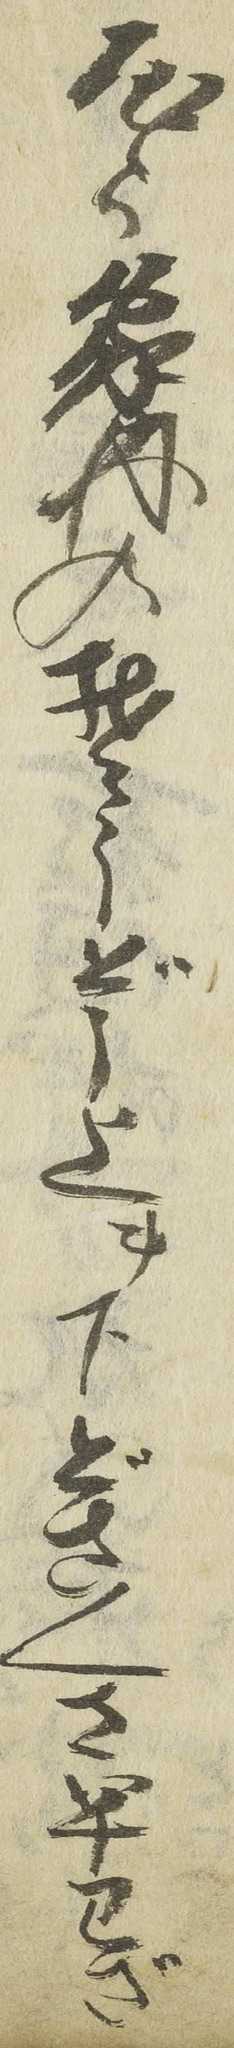やら家内のそうどう上ヲ下どさくさ早わざ
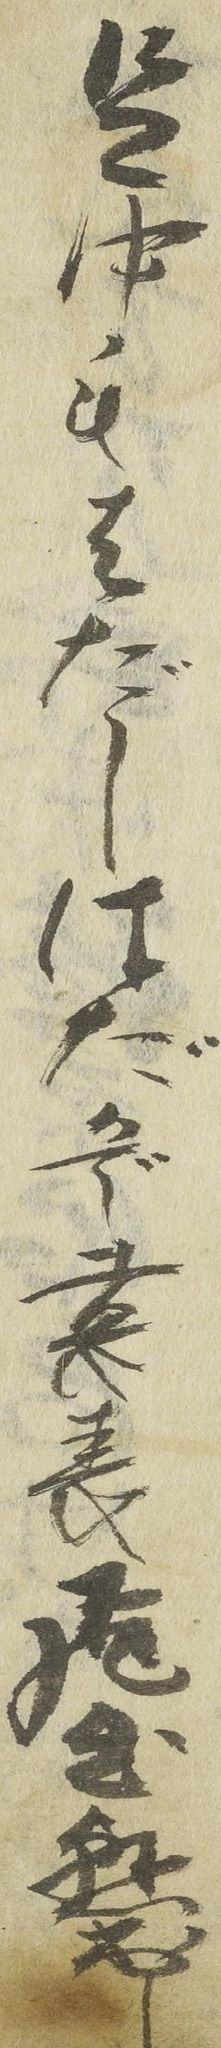是中もはだしはだかで裏表飛出懸出し

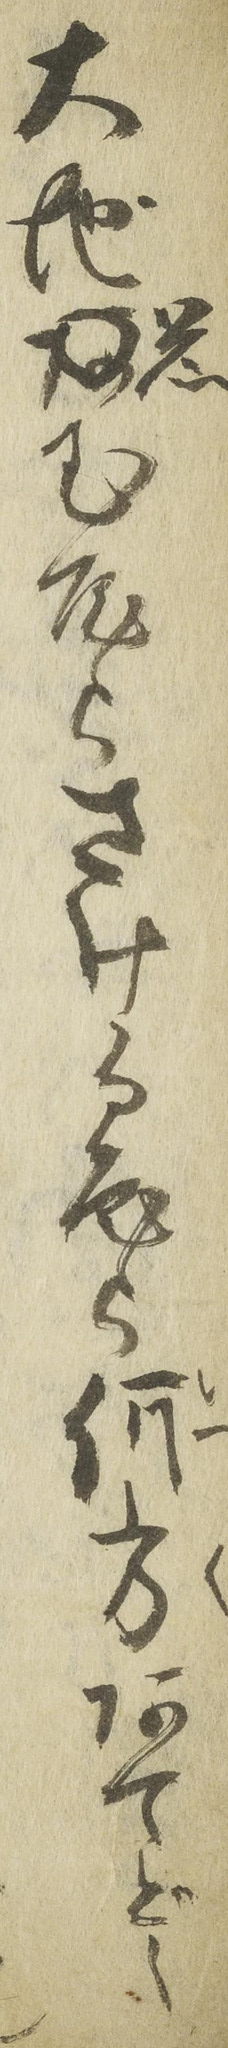大地ゑむやらさけるやら何方あてども
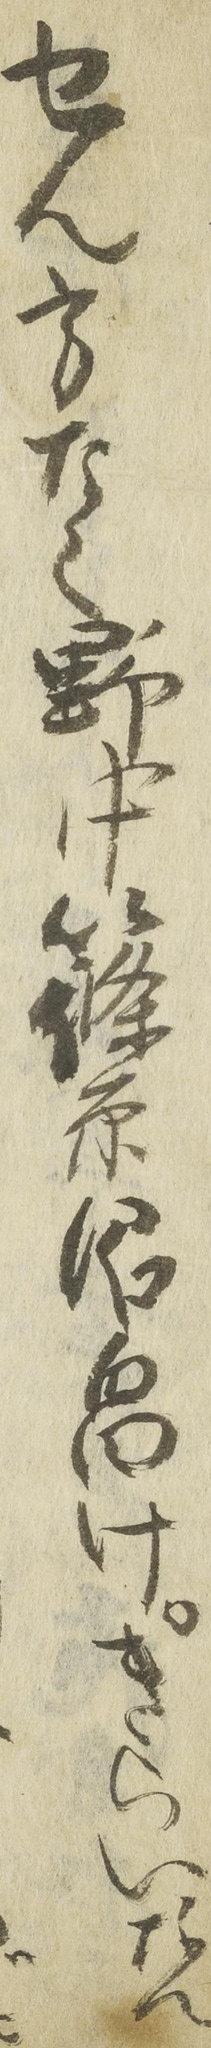せん方なく野中篠原沼畠け。きらいなん
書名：善光寺地震聞書
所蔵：東京大学地震研究所図書室 Earthquake Research Institute Library, The University of Tokyo, JAPAN
